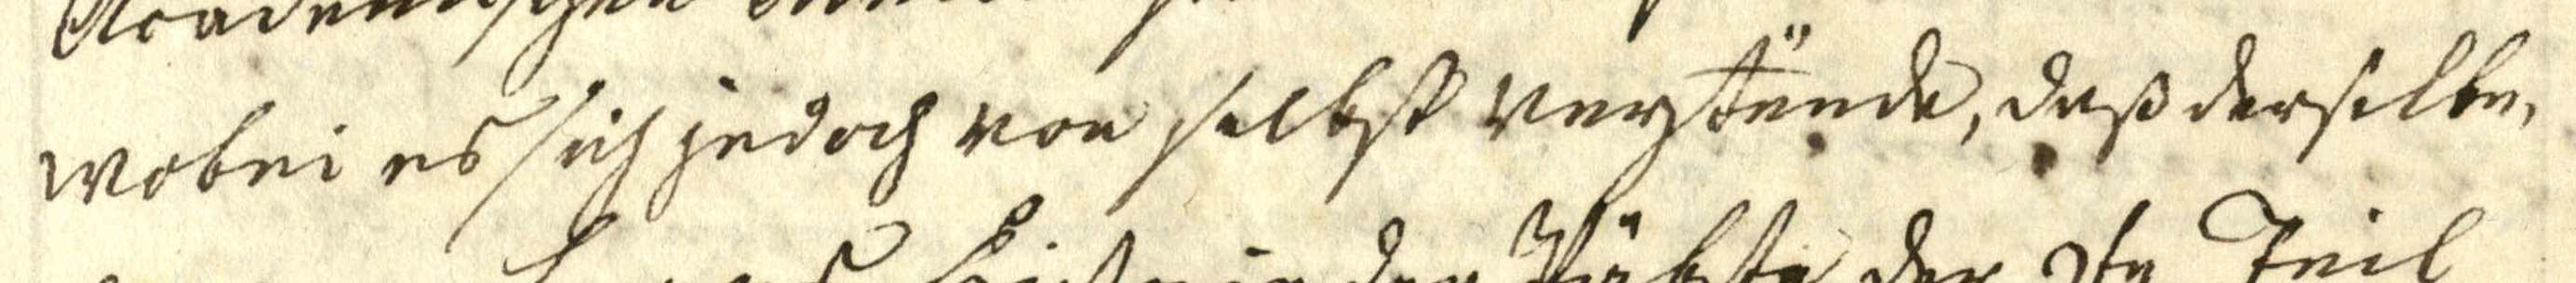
Wobei es sich jedoch von selbst verstünde, daß derselbe,
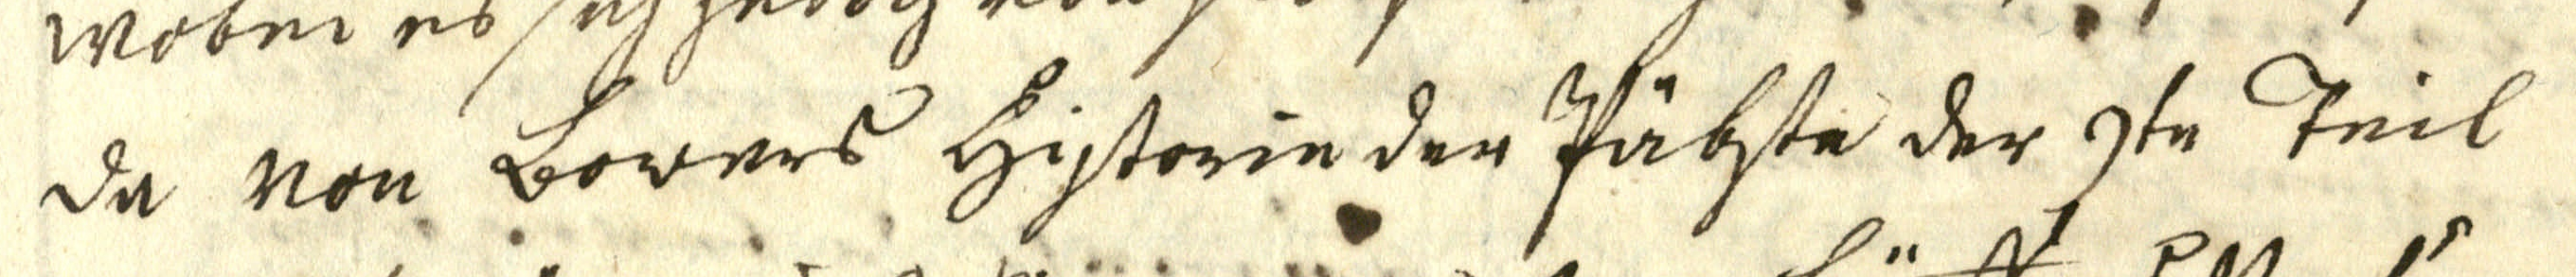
da von Bowers Historie der Päbste der 9te Teil
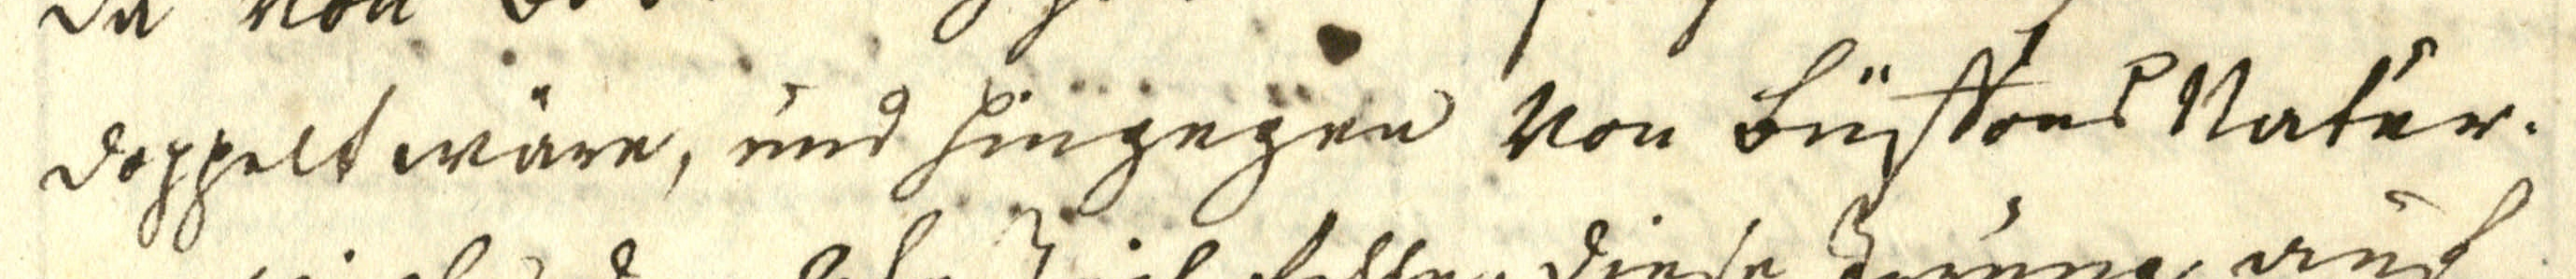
doppelt wäre, und hingegen von Büssons Natur¬
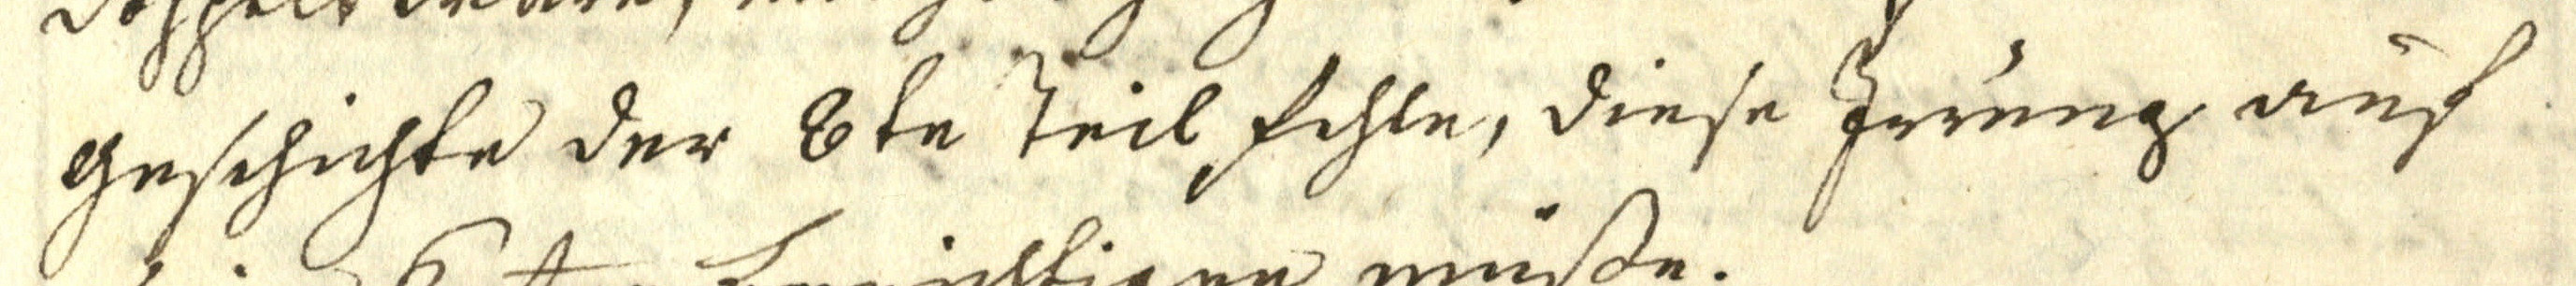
Geschichte der 8te Teil fehle, diese Irrung auf
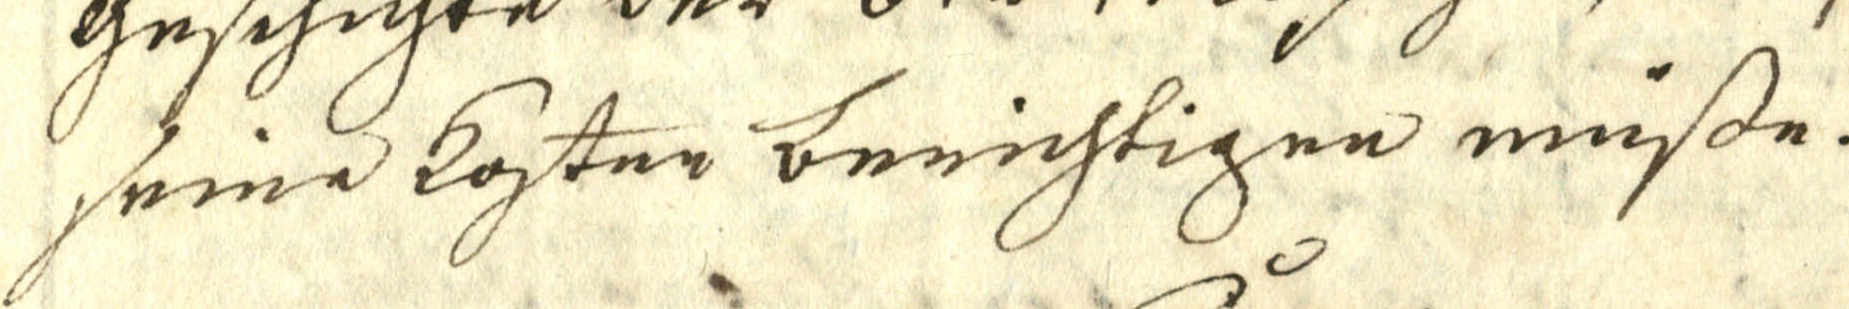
seine Kosten berichtigen müße.
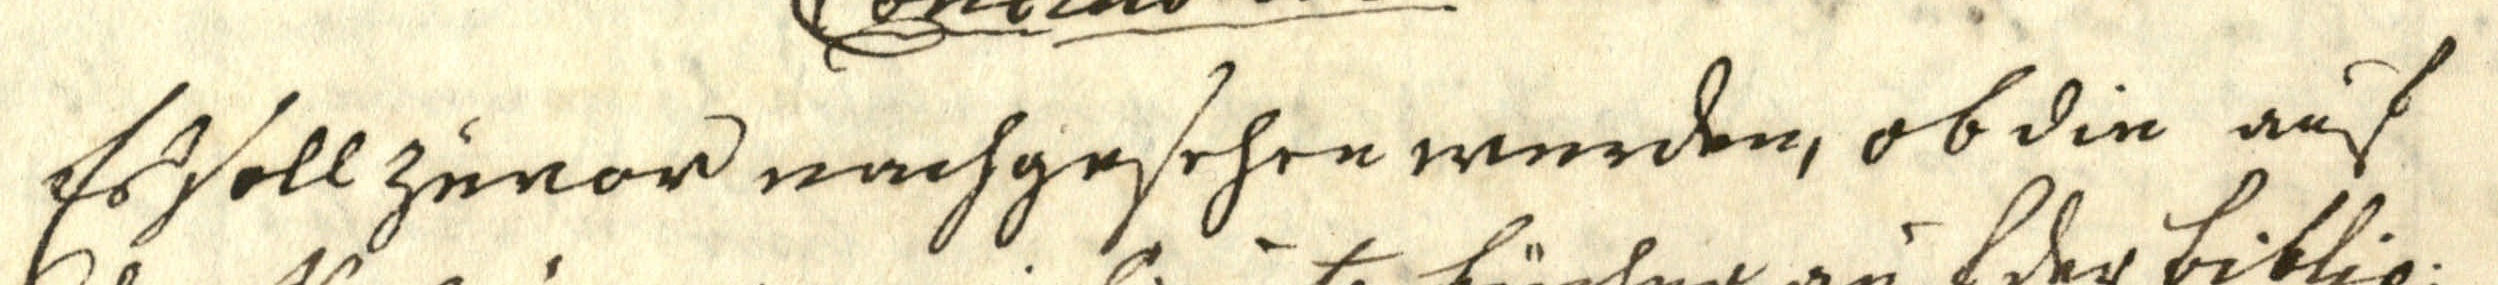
Es soll zuvor nachgesehen werden, ob die auf
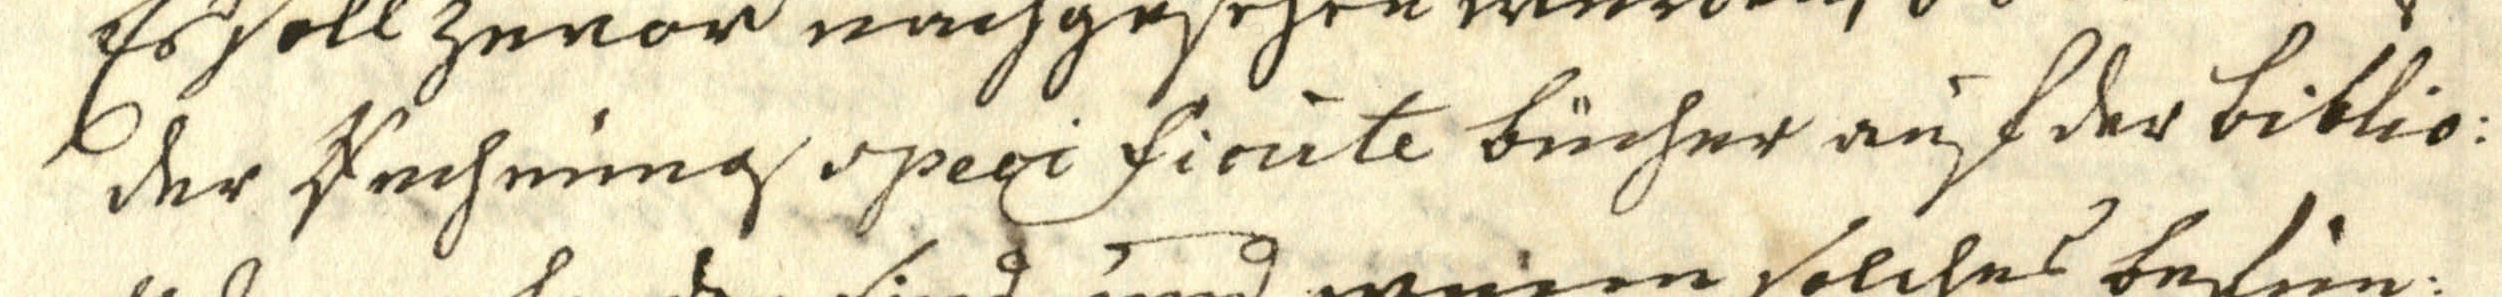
der Rechnung speci ficirte Bücher auf der Biblio¬
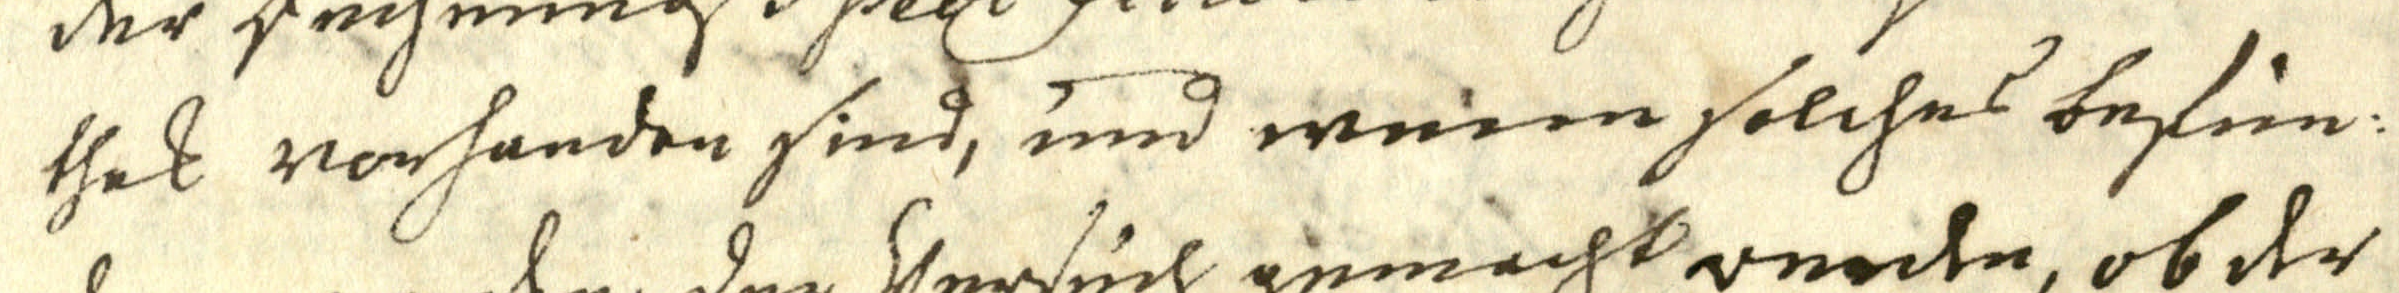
thek vorhanden sind, und wenn solches befun¬
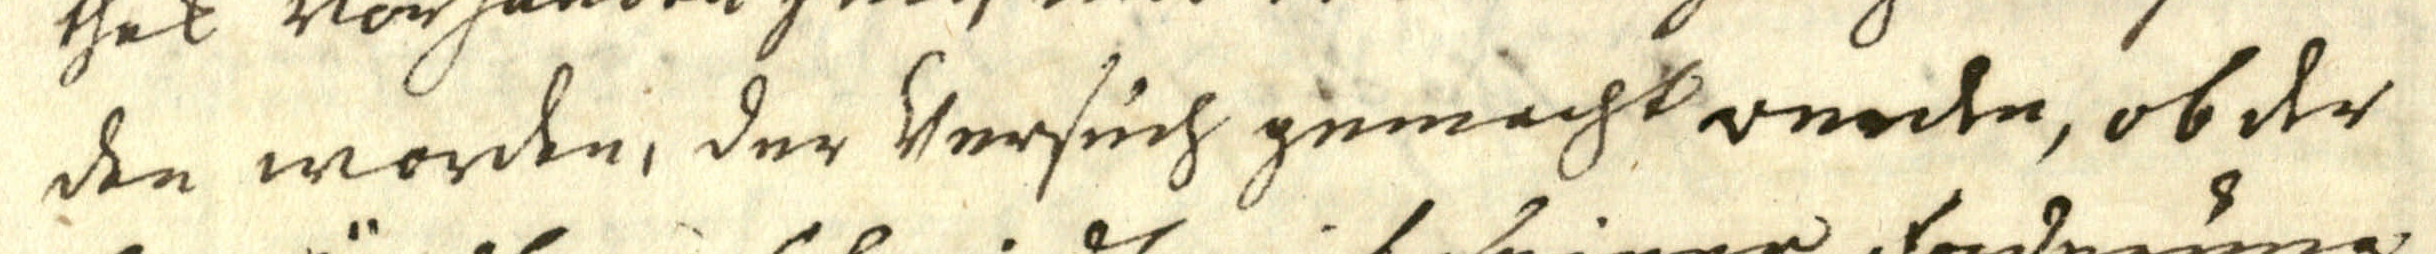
den worden, der Versuch gemacht werden, ob der
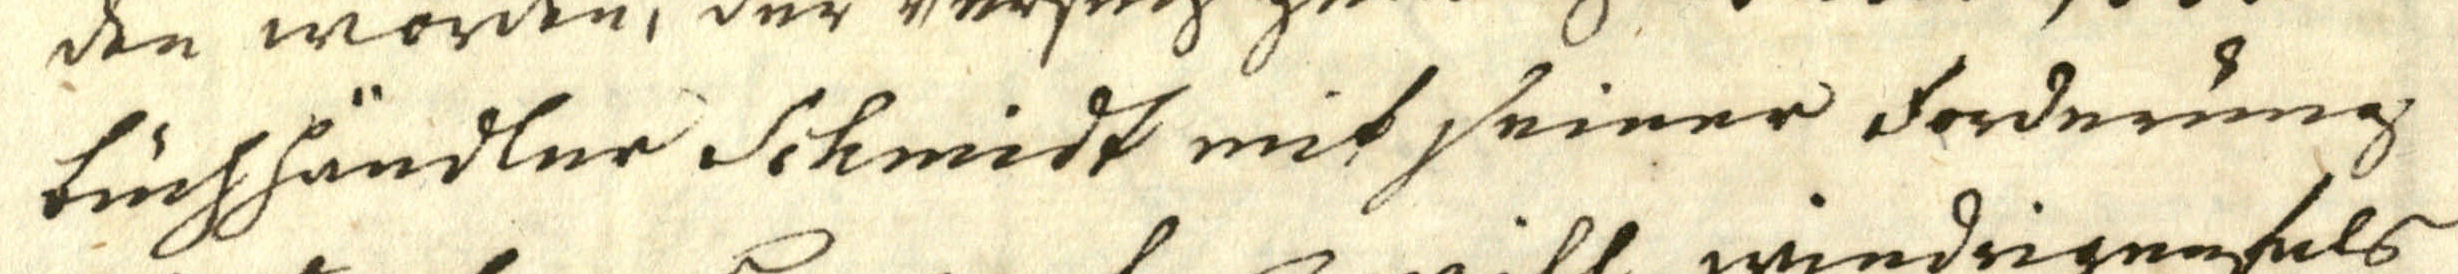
Buchhändler Schmidt mit seiner Forderung
